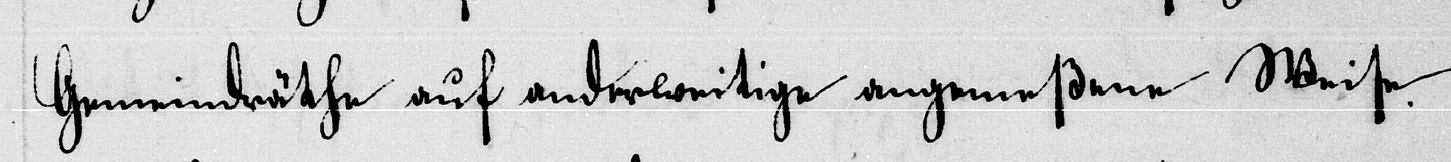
Gemeindräthe auf anderweitige angemeßene Weise
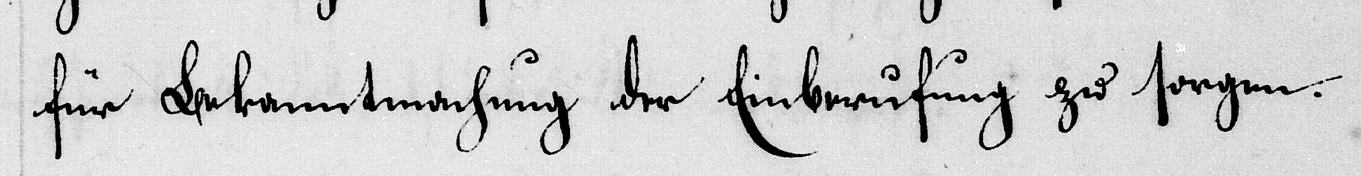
für Bekanntmachung der Einberufung zu sorgen.
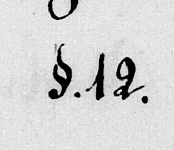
§.12.
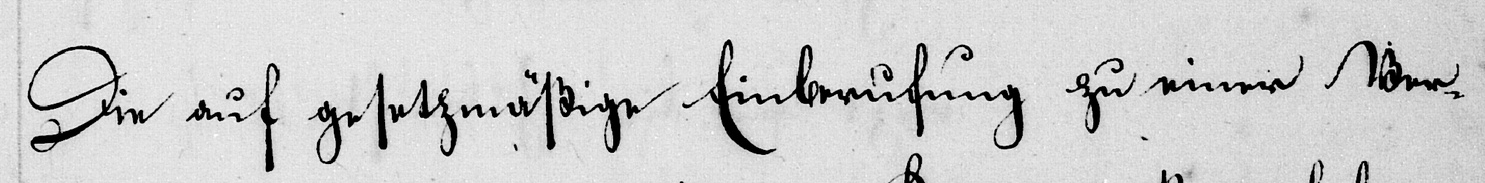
Die auf gesetzmäßige Einberufung zu einer Ver¬
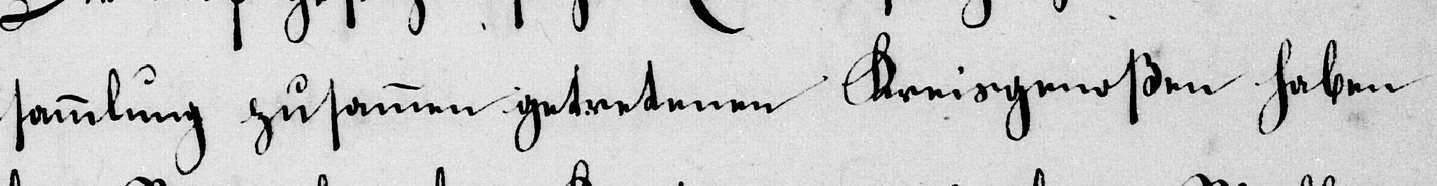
sammlung zusammen getretenen Kreisgenoßen haben
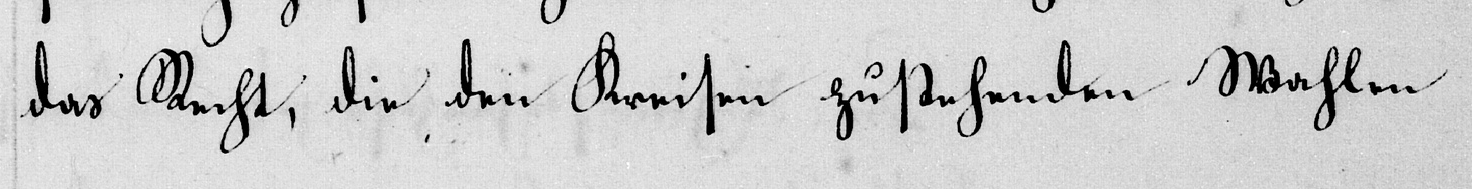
das Recht, die den Kreisen zustehenden Wahlen
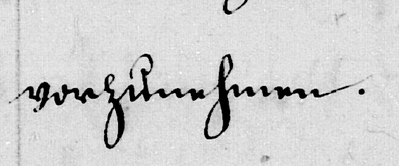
vorzunehmen.
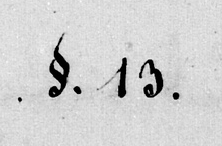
§.13.
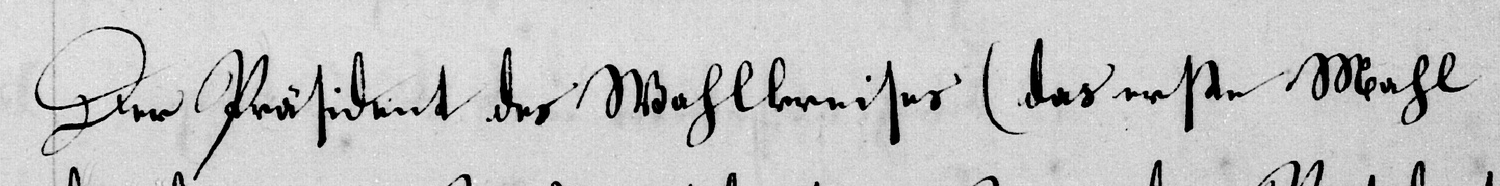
Der Präsident des Wahlkreises (das erste Mahl
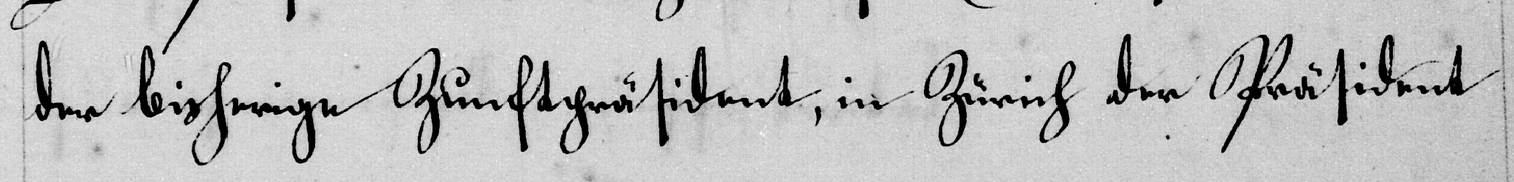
der bisherige Zunftpräsident, in Zürich der Präsident
